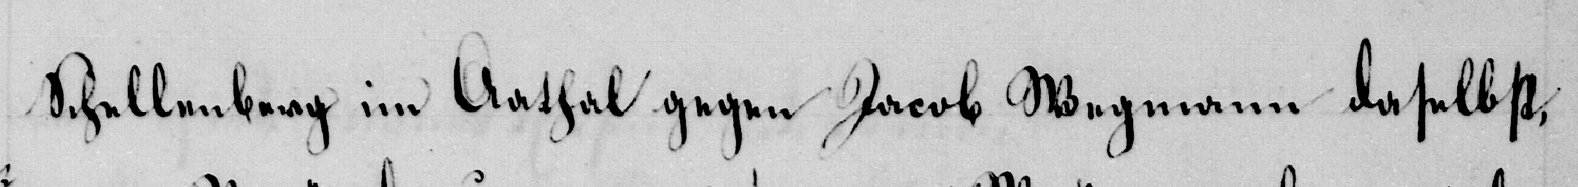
Schellenberg im Aathal gegen Jacob Wegmann daselbst,
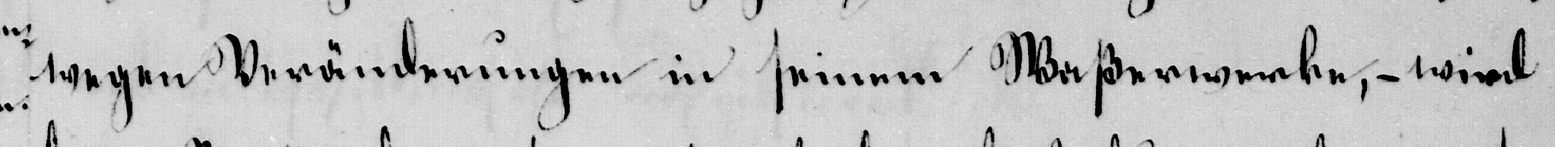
wegen Veränderungen in seinem Waßerwerke, – wird
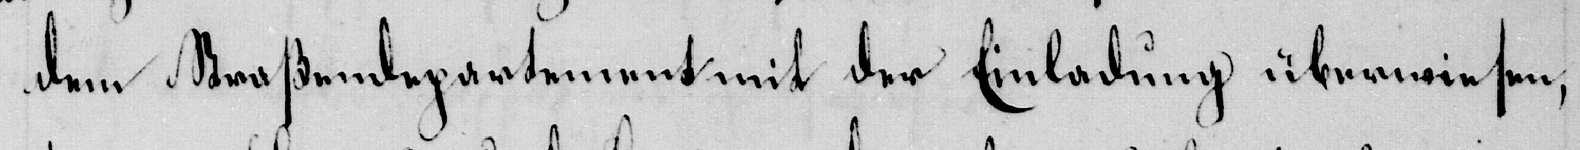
dem Straßendepartement mit der Einladung überwiesen,
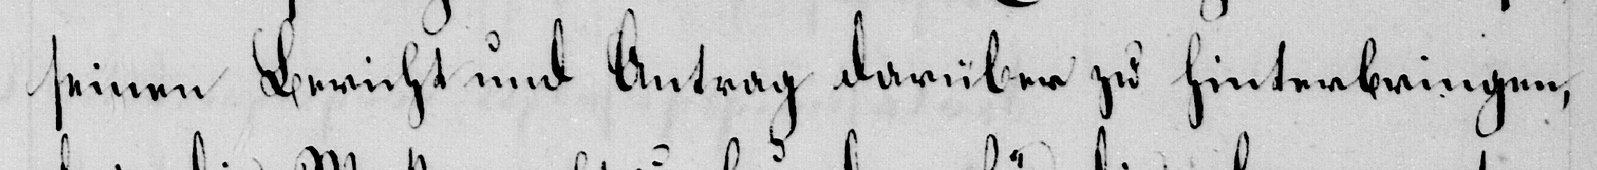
seinen Bericht und Antrag darüber zu hinterbringen,
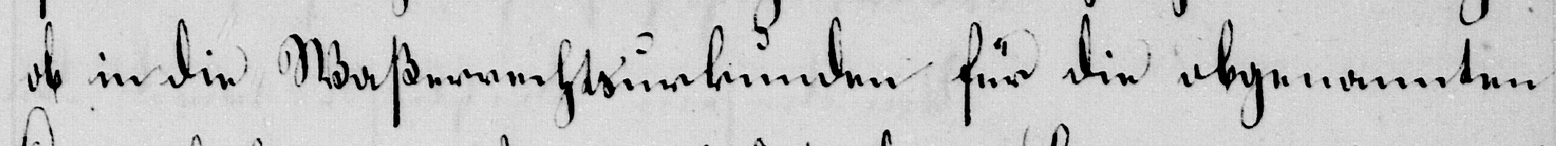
ob in die Waßerrechtsurkunden für die obgenannten
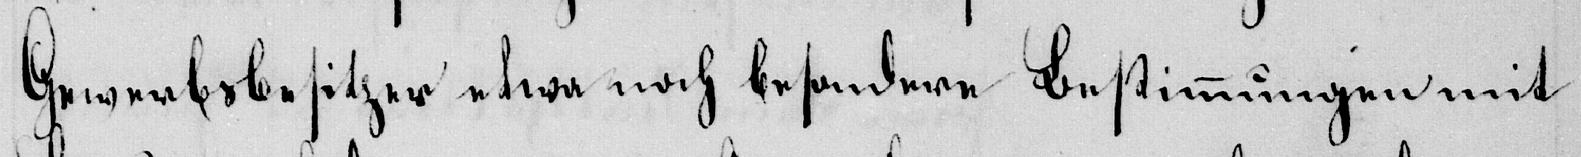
Gewerbsbesitzer etwa noch besondere Bestimmungen mit
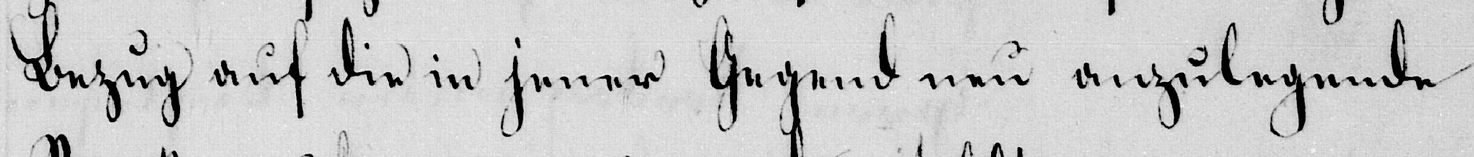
Bezug auf die in jener Gegend neu anzulegende
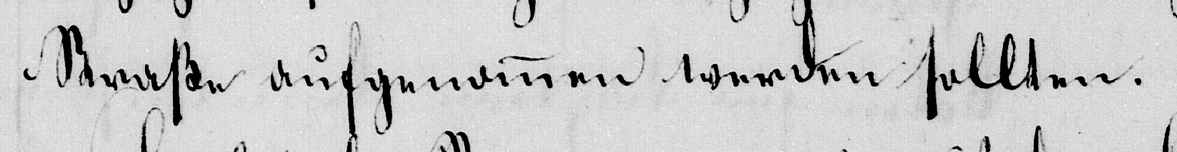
Straße aufgenommen werden sollten.
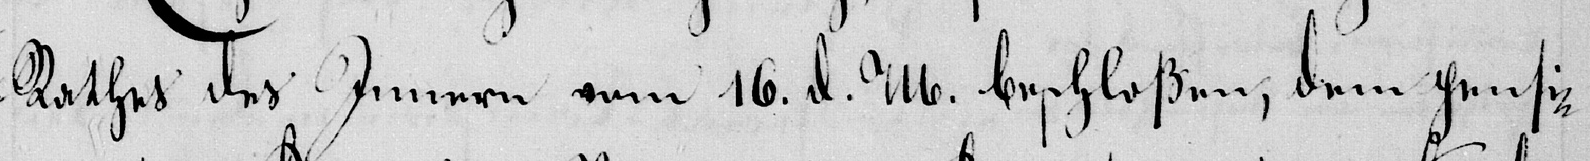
Rathes des Innern vom 16. d. M. beschloßen, dem pensi¬
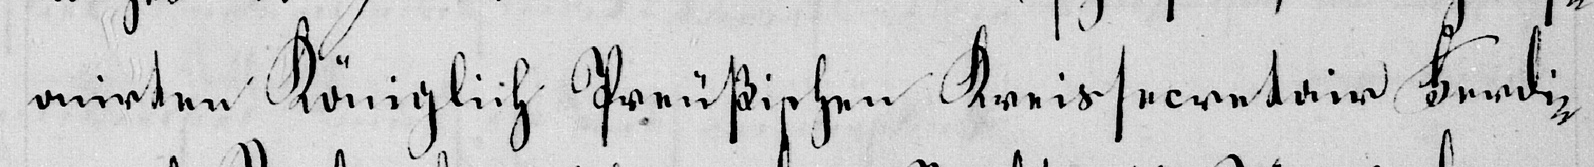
onirten Königlich Preußischen Kreissecretair Ferdi¬
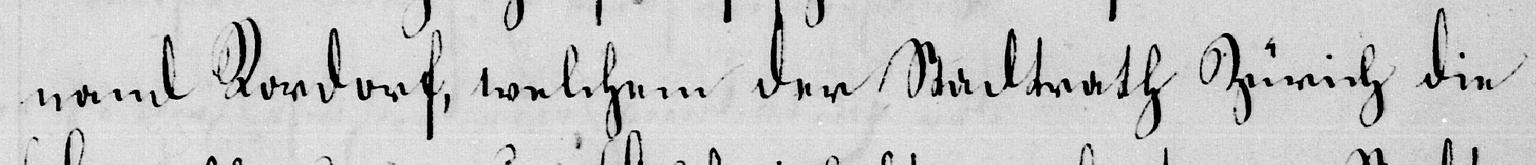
nand Rordorf, welchem der Stadtrath Zürich die
